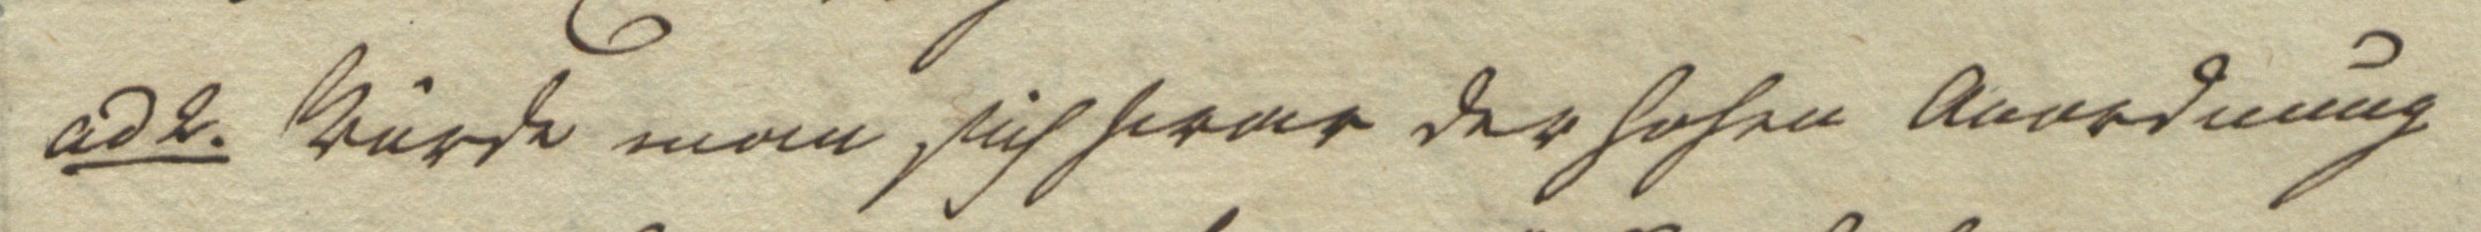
ad 2. Würde man sich zwar der hohen Anordnung
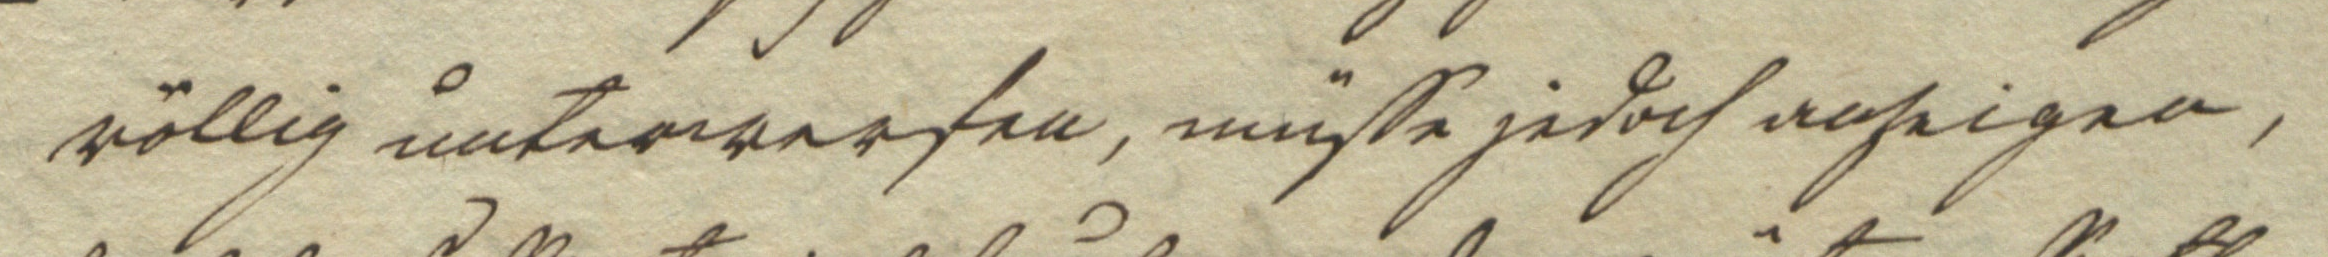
völlig unterwerfen, müsse jedoch anzeigen,
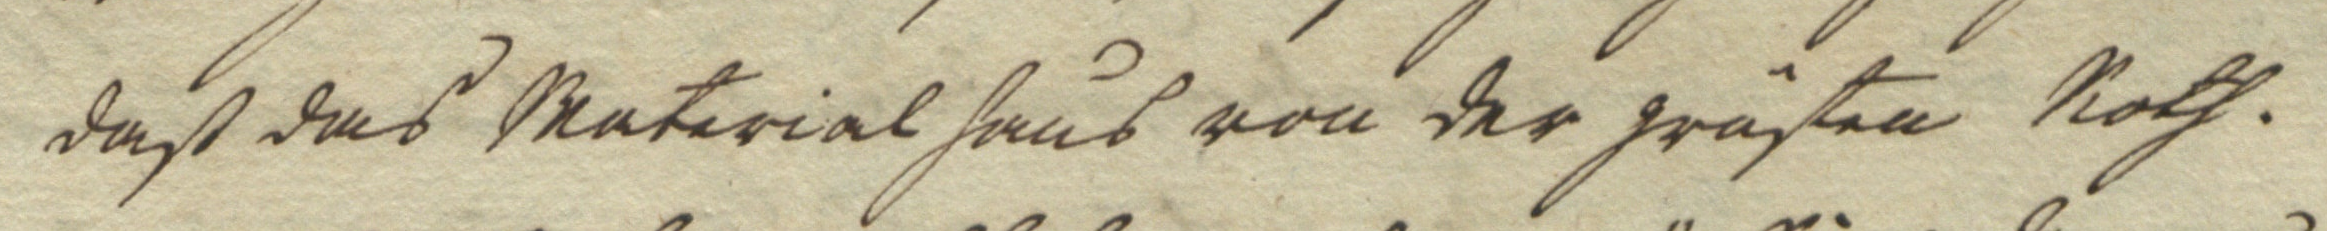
daß das Materialhaus von der grösten Noth¬
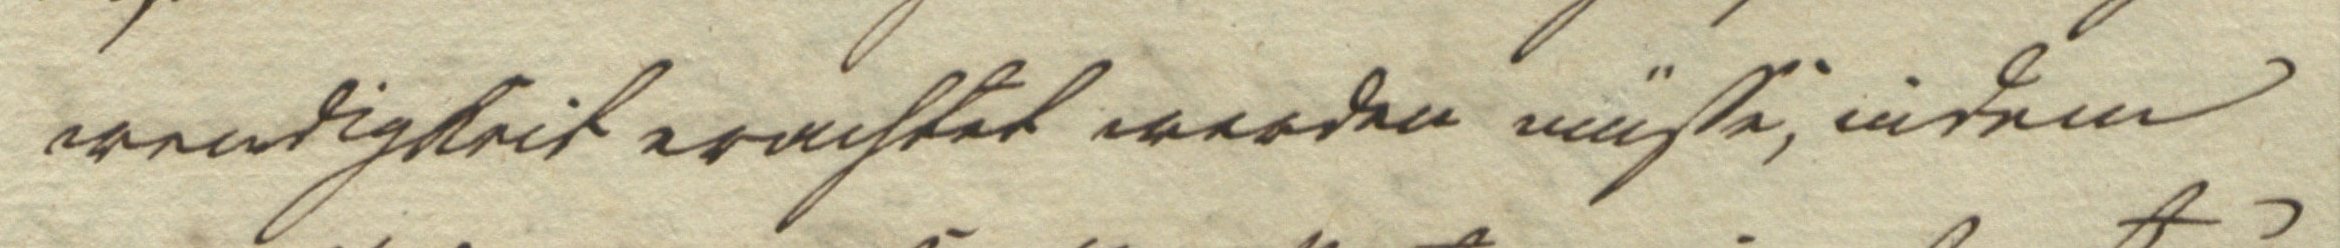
wendigkeit erachtet werden müsse, indem
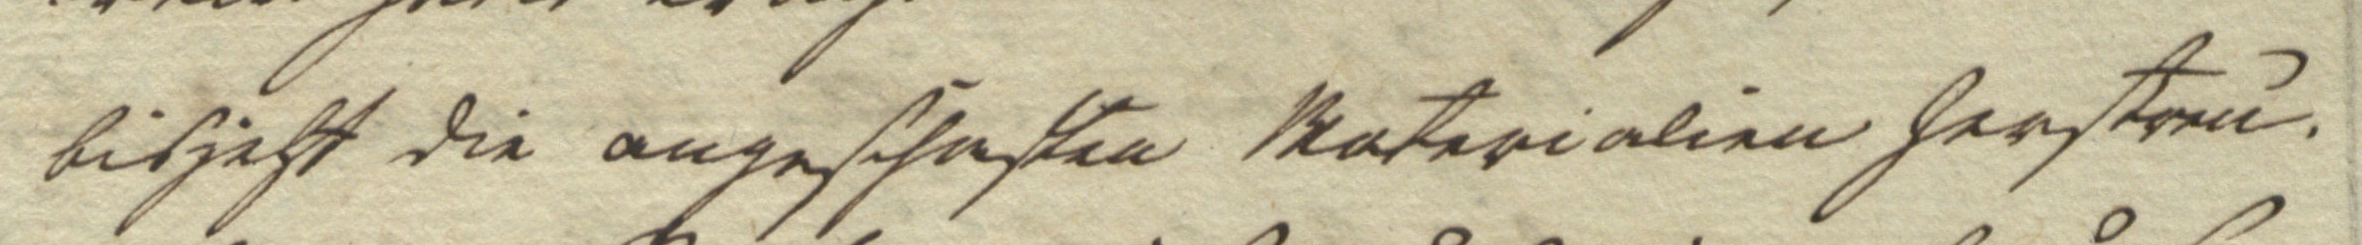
bis jetzt die angeschafften Materialien zerstreu¬
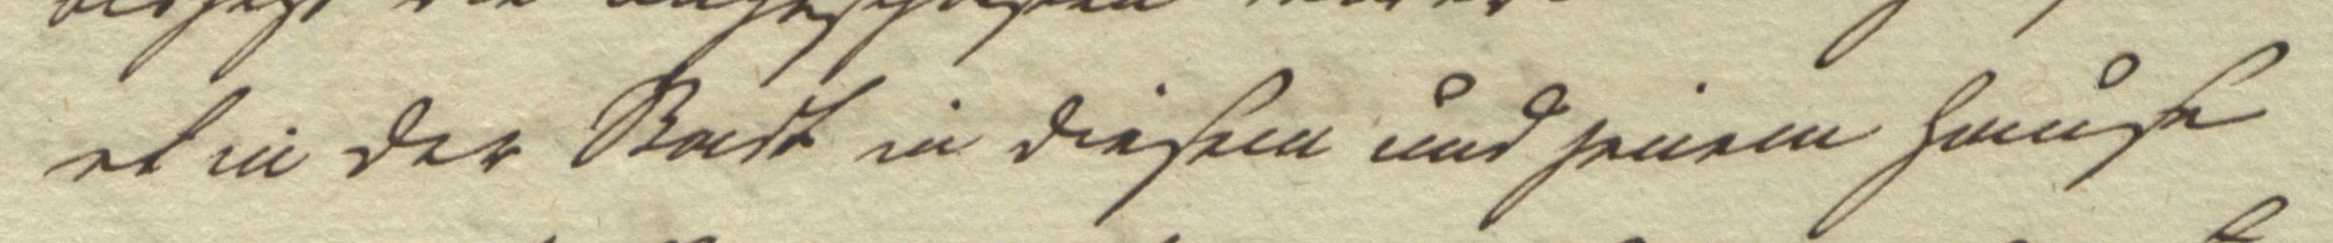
et in der Stadt in diesem und jenem Hause
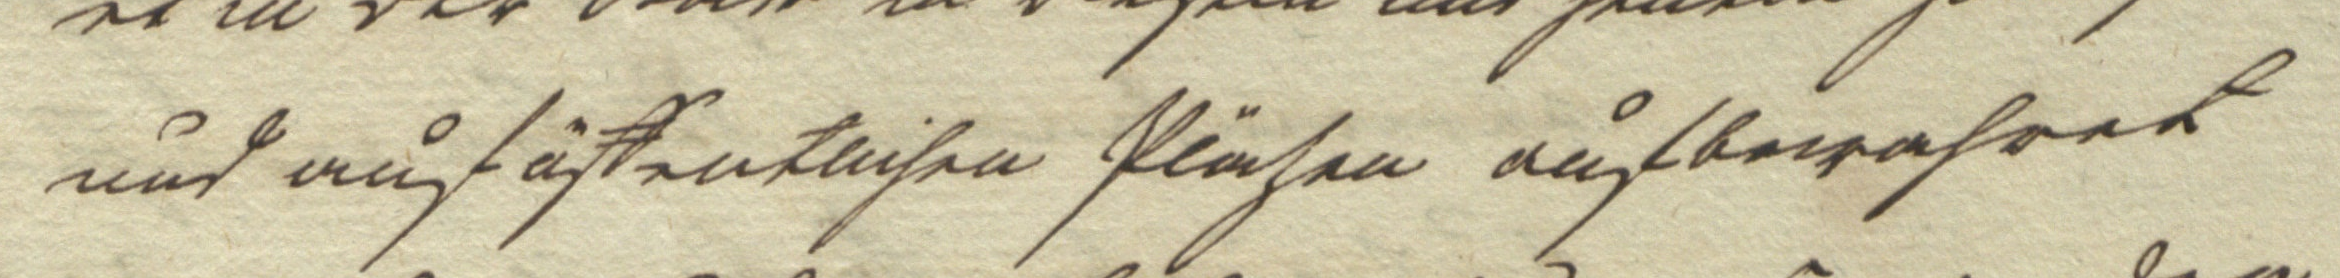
und auf öffentlichen Plätzen aufbewahret
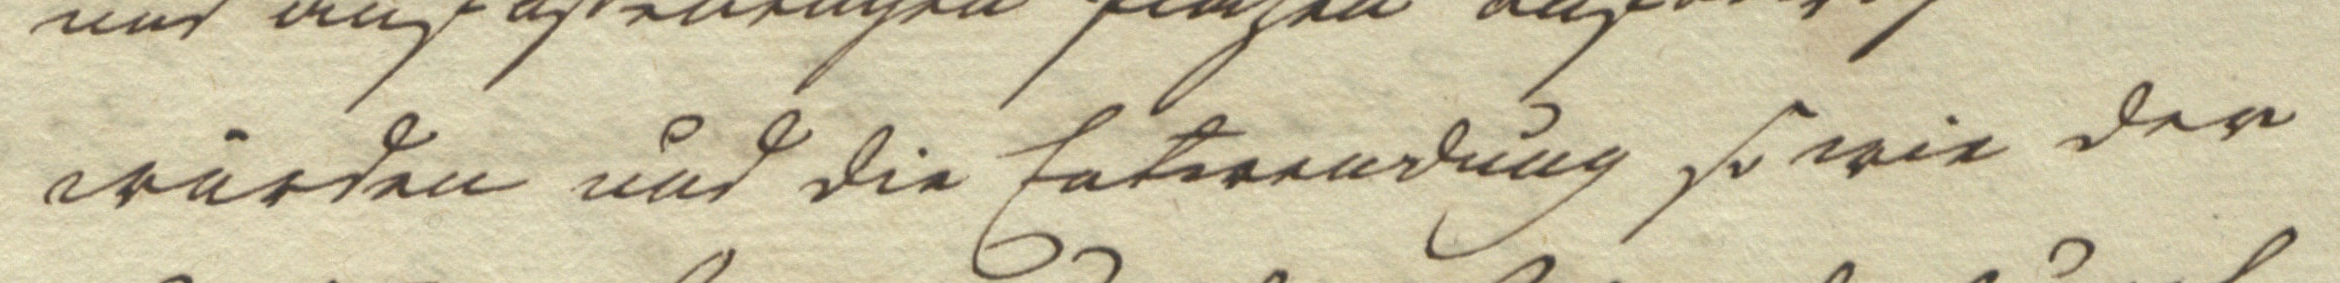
würden und die Entwendung so wie der
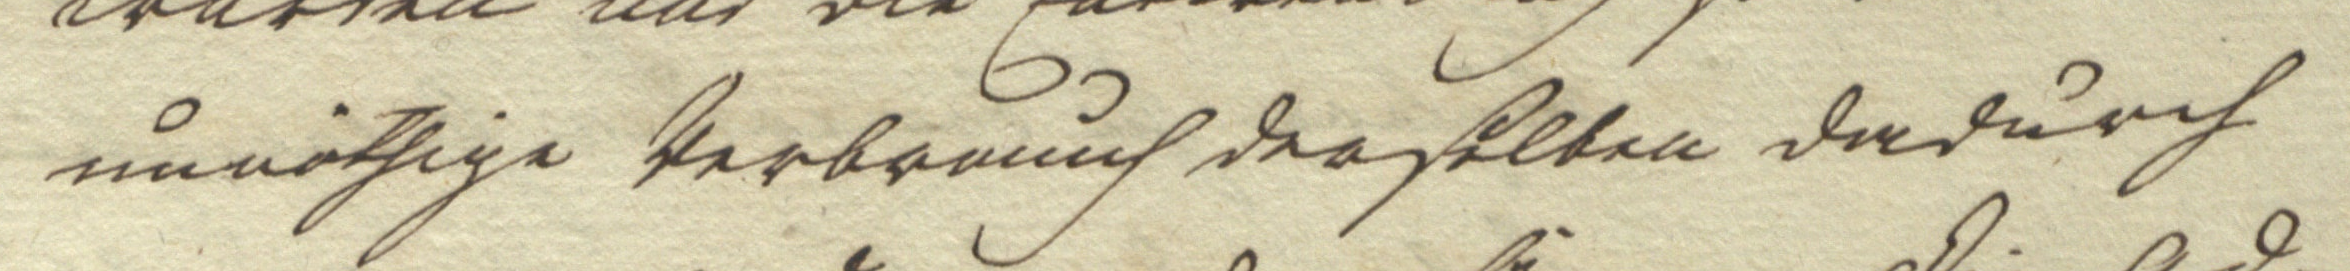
unnöthige Verbrauch derselben dadurch
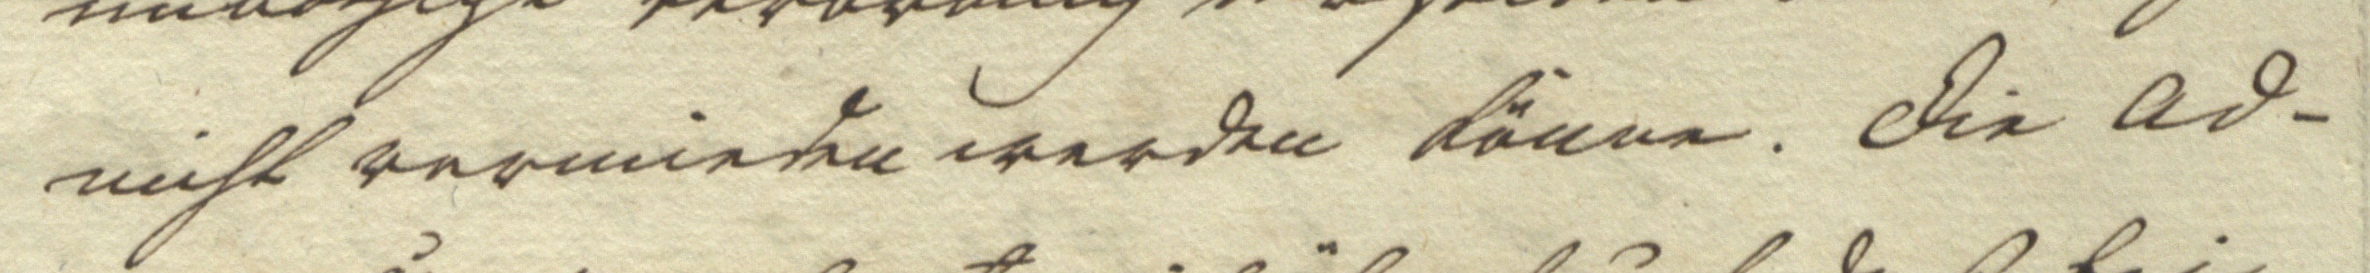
nicht vermieden werden könne. Die Ad¬
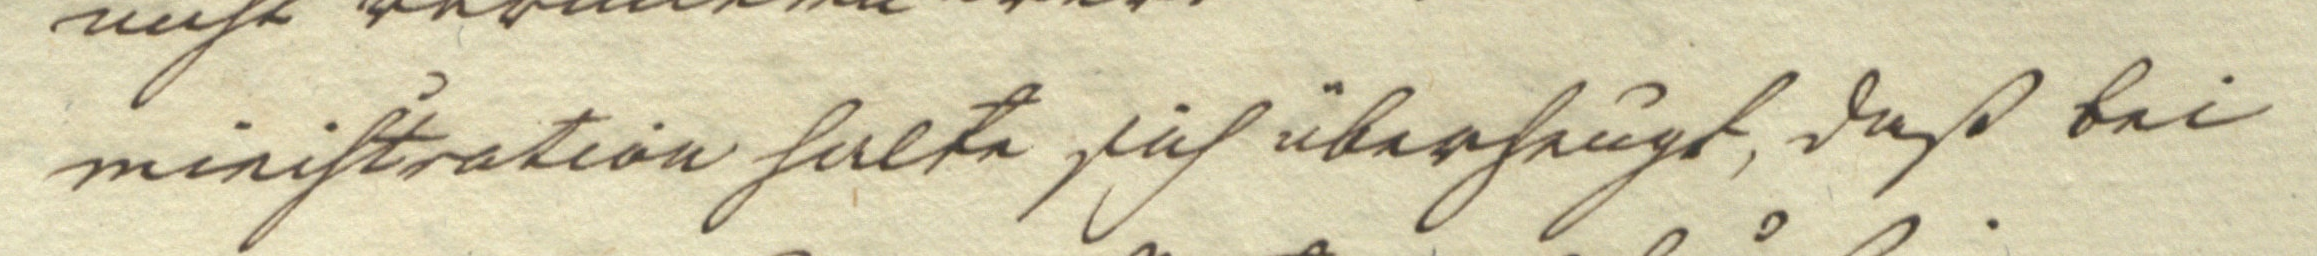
ministration halte sich überzeugt, daß bei
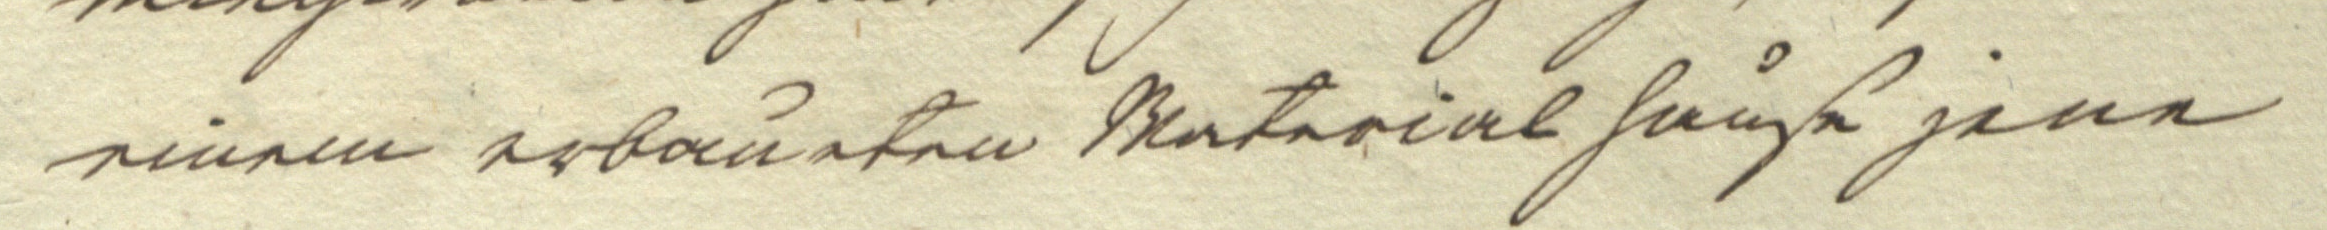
einem erbaueten Materialhause jene
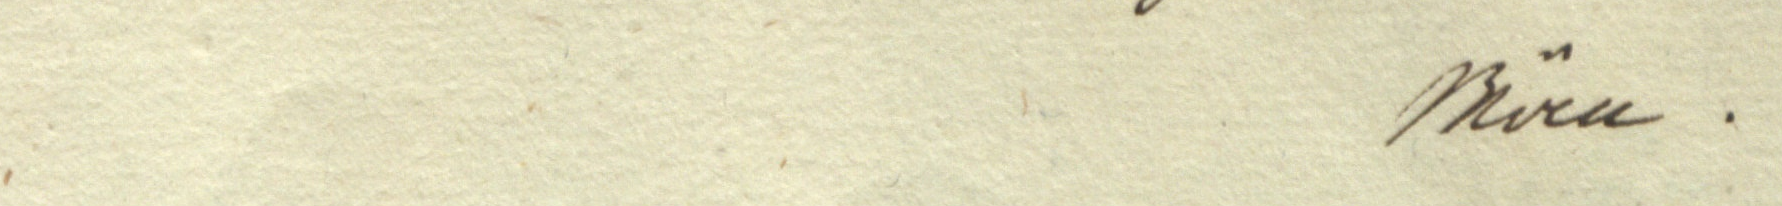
Män
